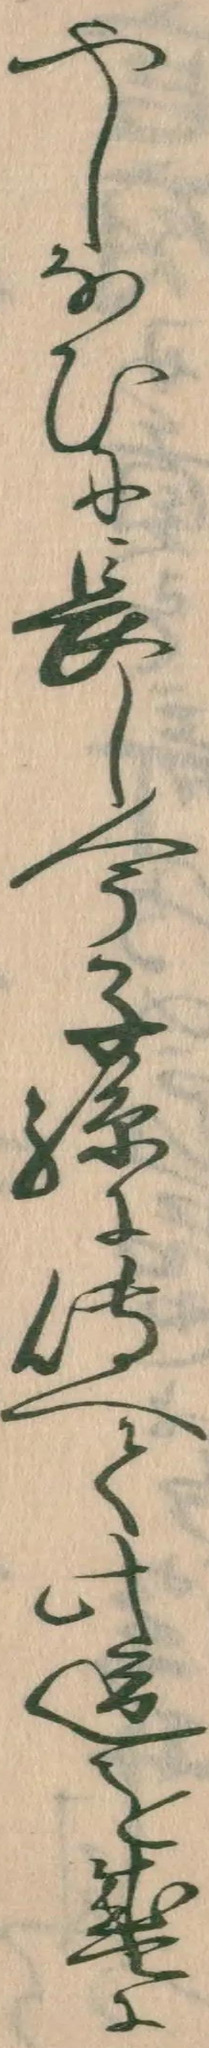やしなひに長し今子孫に伝へて此道を盛に
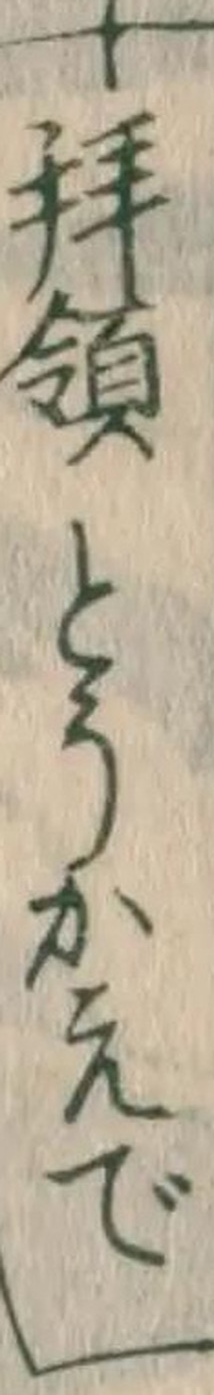拝領とうかえで
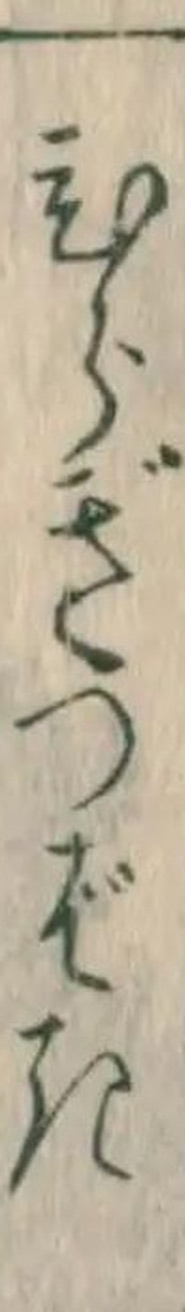ひらぎつばき
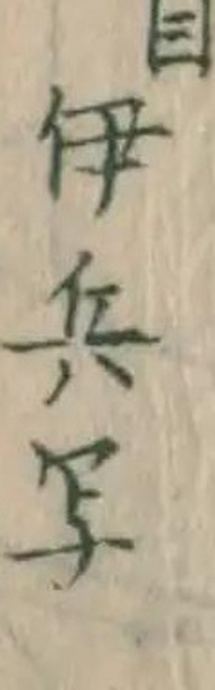伊兵写

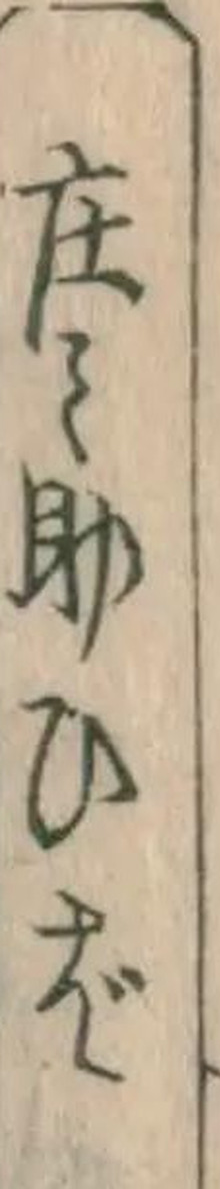染井庄之助ひば
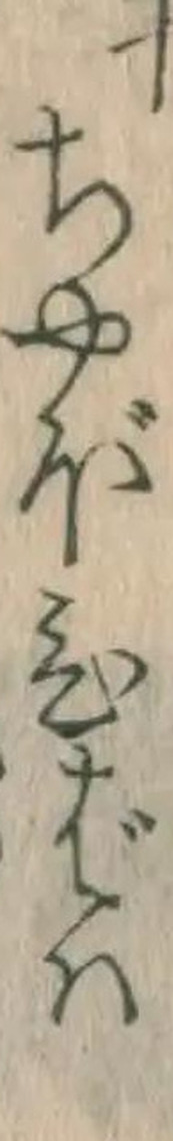ちやぼひばは
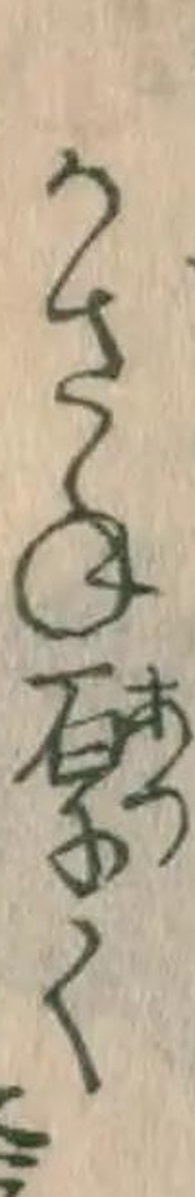かさね厚く
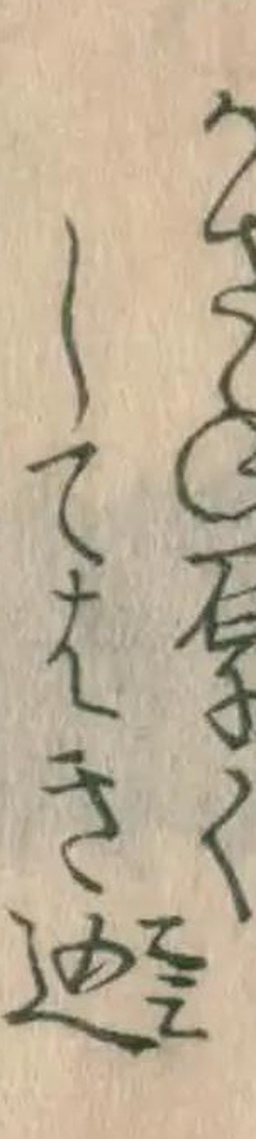してはき込
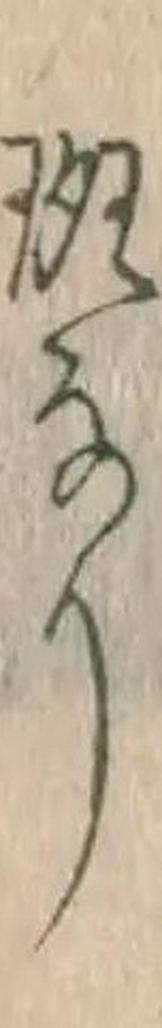斑なり
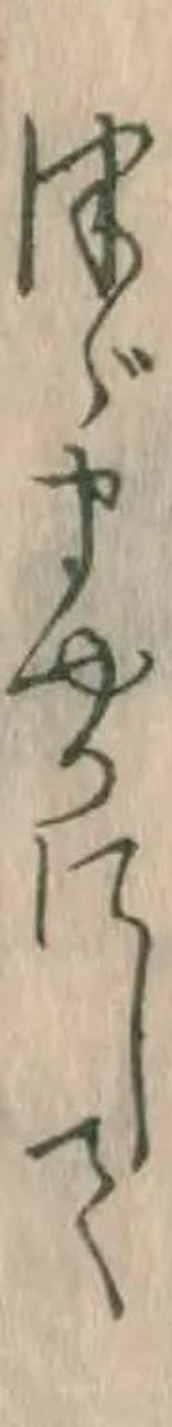つゞまやかにして
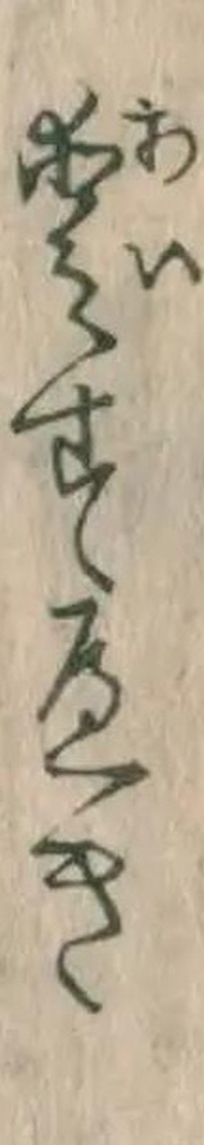愛すへき
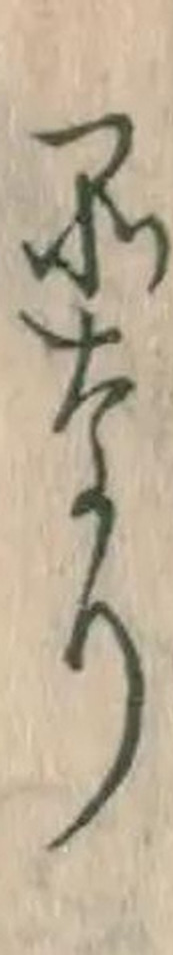品なり
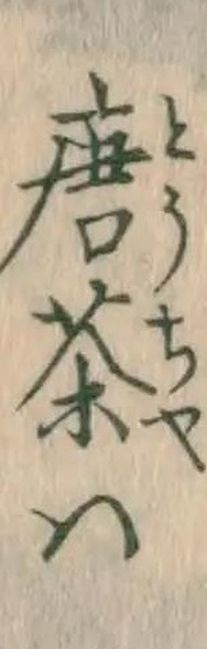唐茶は
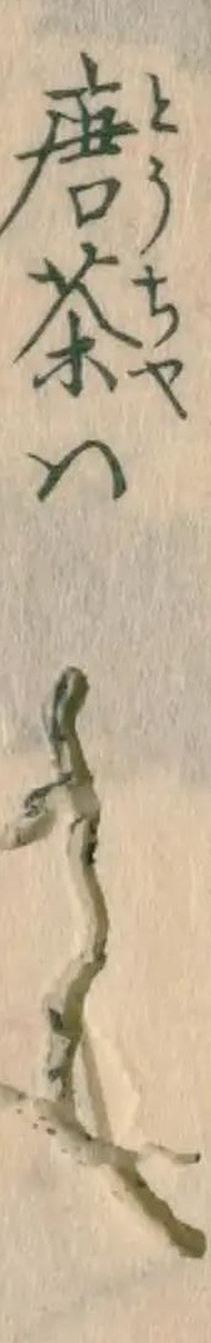唐茶は
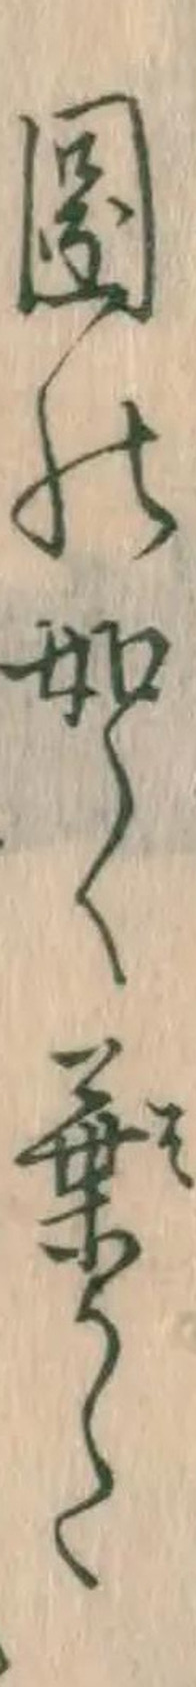図の如く葉かた
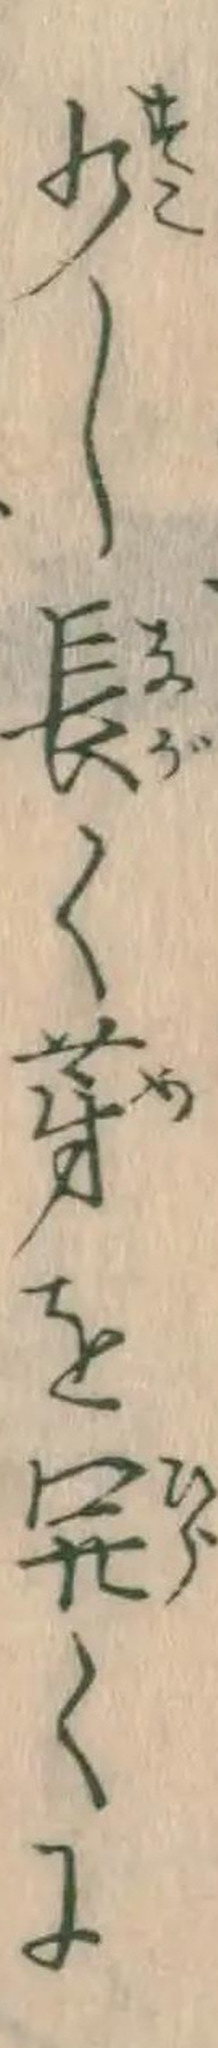少し長く芽を開くに
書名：草木奇品家雅見 3巻. [3]
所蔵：国立国会図書館 National Diet Library, JAPAN
